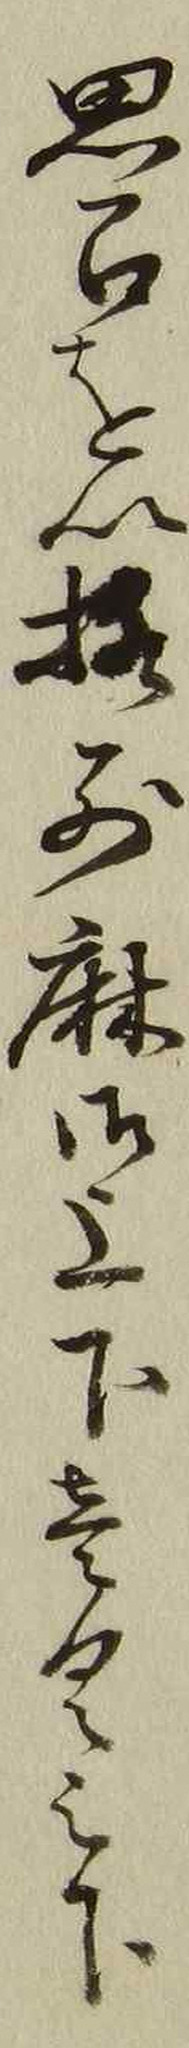思召を以格別麻御上下壱具被下
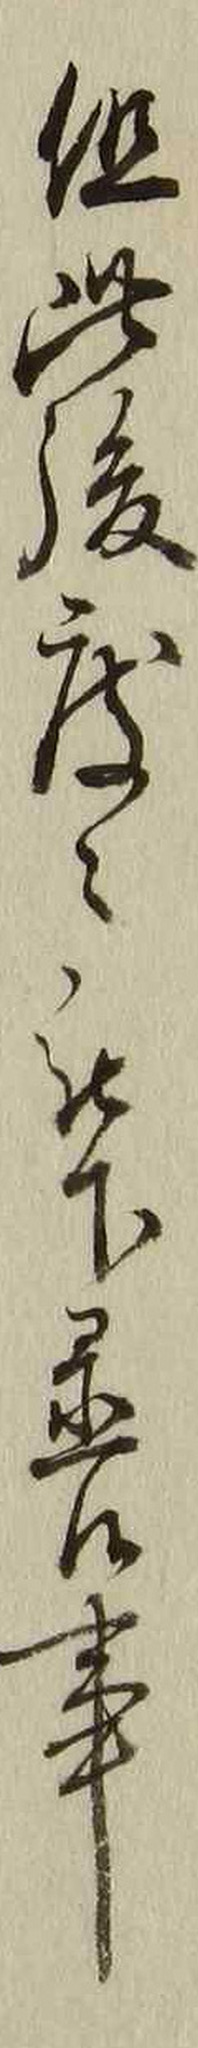但此後度々被下置候事
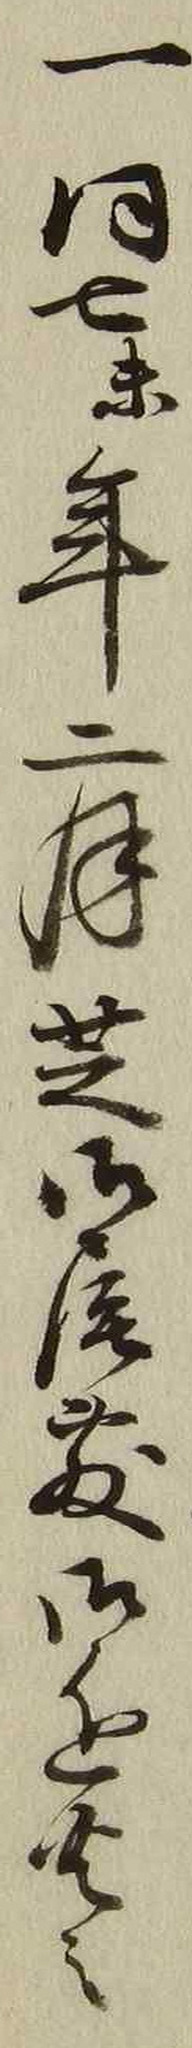一同七未年二月芝御屋敷御近火之
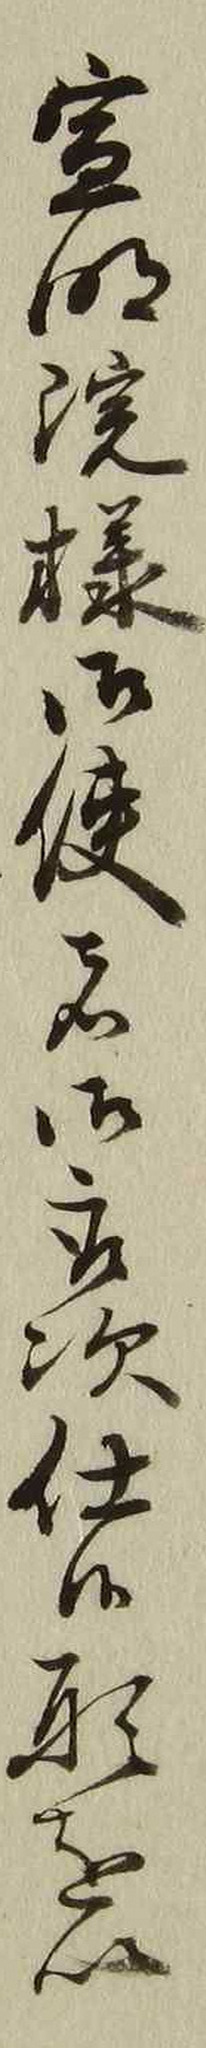宣明院様御使者御取次仕候形を以
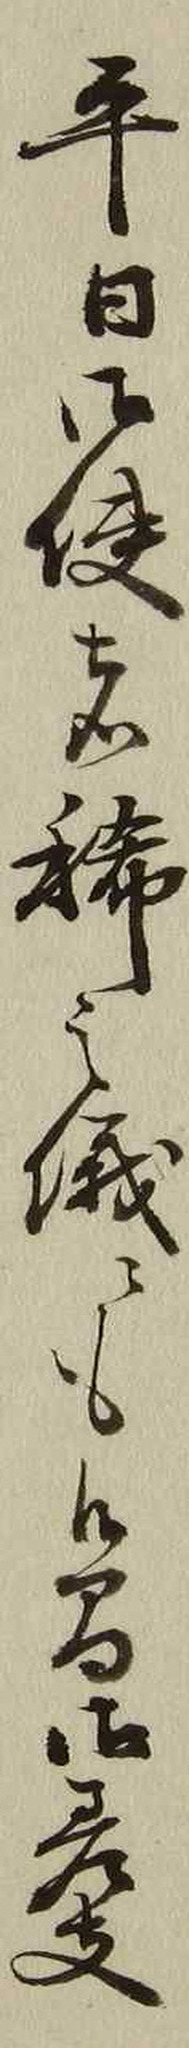平日御使者稀之儀ニも候間御差支
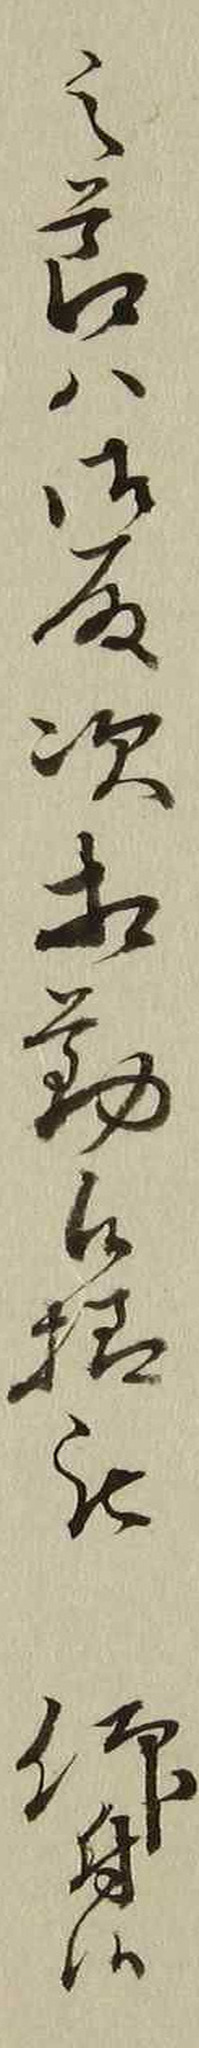之節ハ御取次相勤候様被仰付候
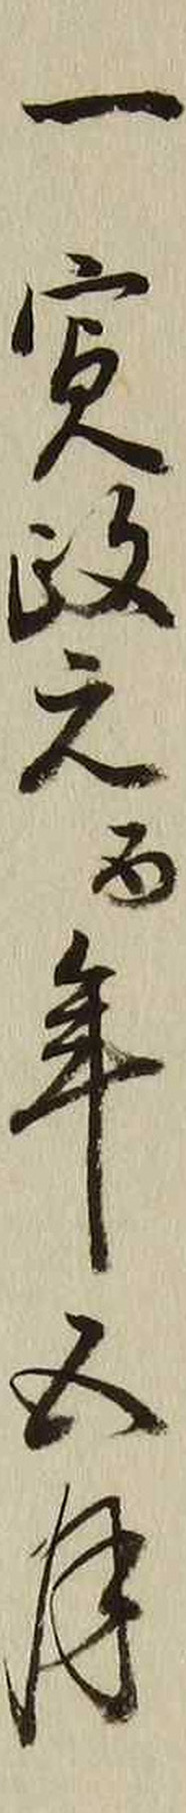一寛政元酉年五月
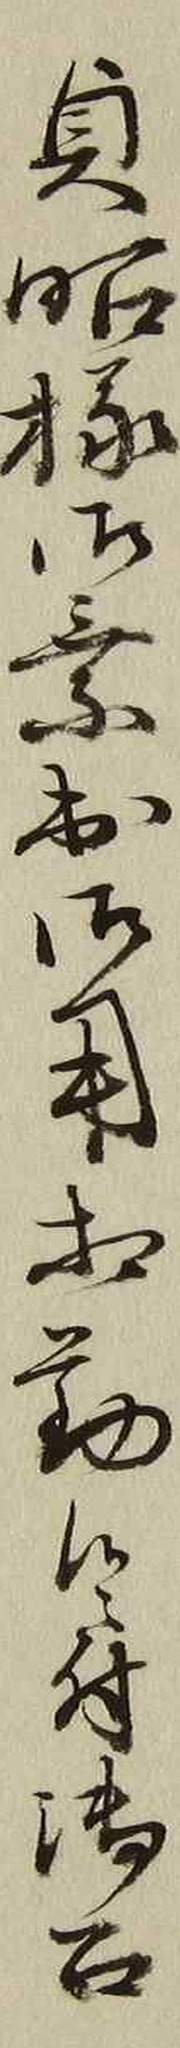貞昭様御乗出御用相勤候ニ付御召
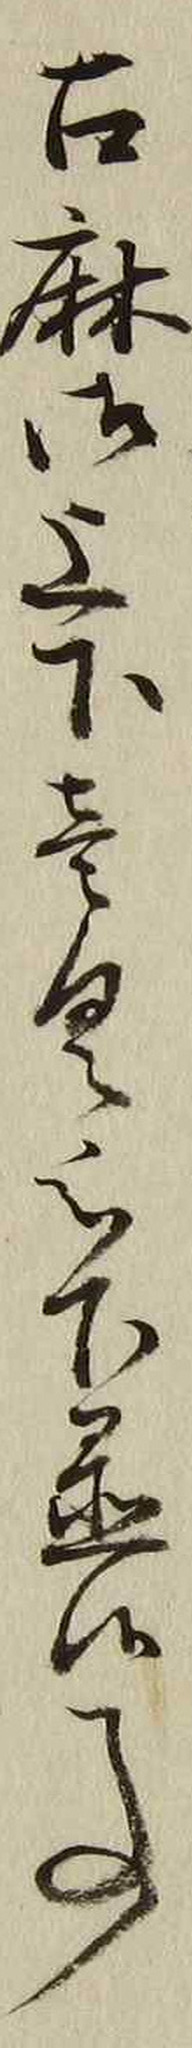古麻御上下壱具被下置候事
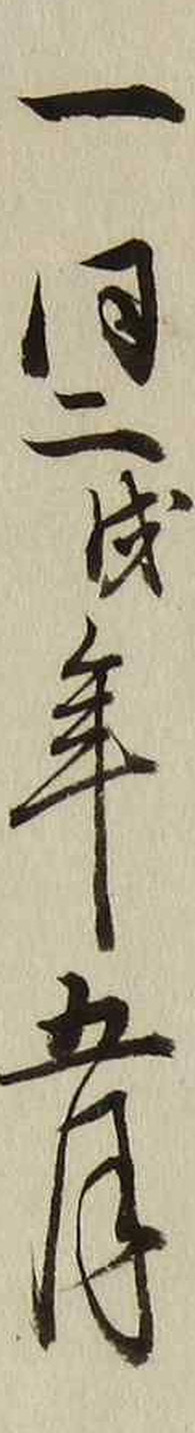一同二戌年五月
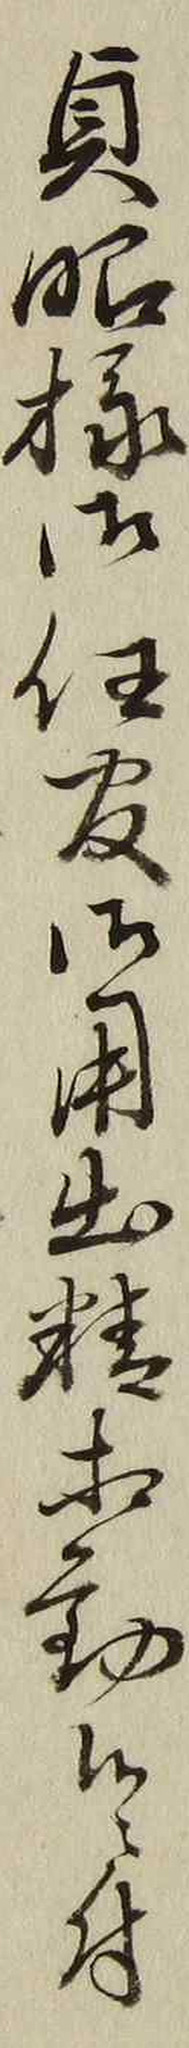貞昭様御任官御用出精相勤候ニ付
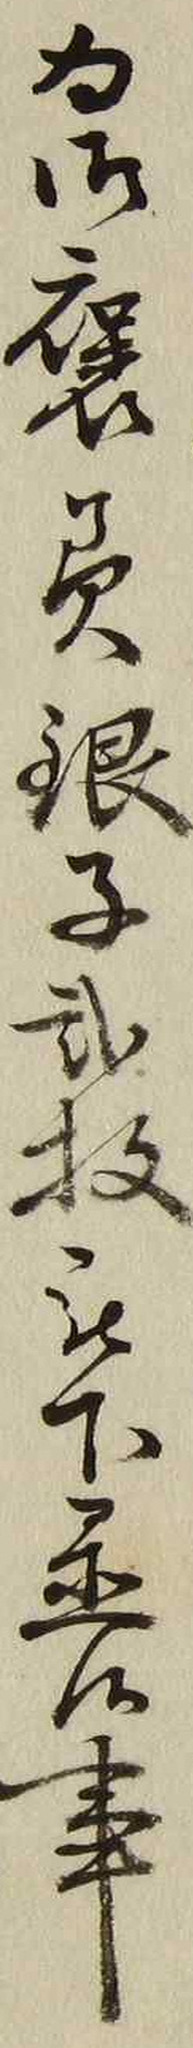為御褒美銀子弐枚被下置候事
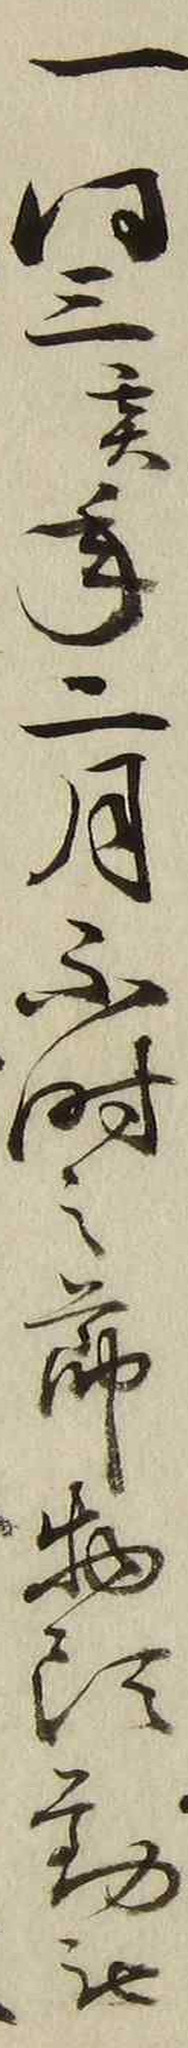一同三亥年二月不時之節物頭勤被
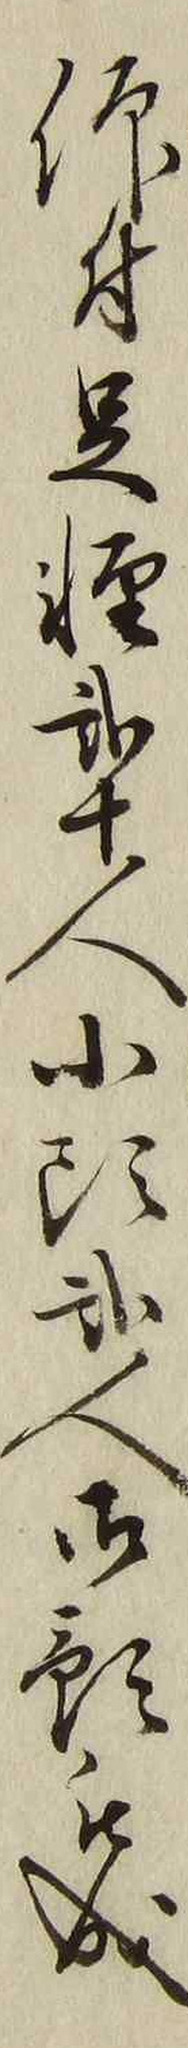仰付足軽弐十人小頭弐人御預被成

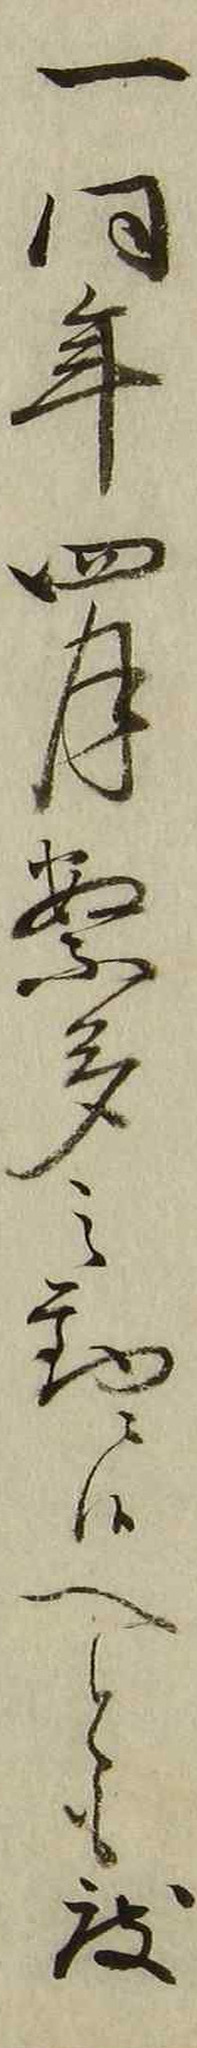一同年月四繁多之勤ニ候へとも度
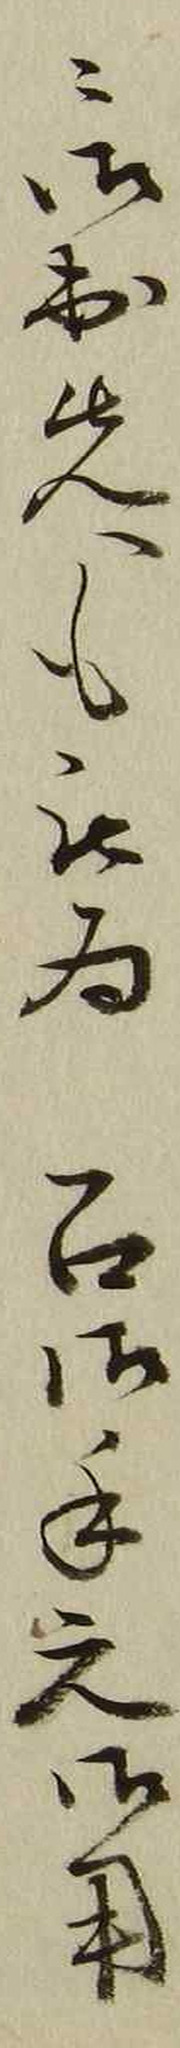々御出へも被為召御手元御用
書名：諸士系譜　巻之35　は之部3
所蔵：会津若松市立会津図書館
